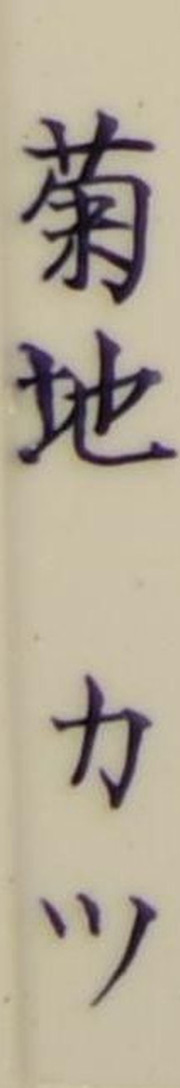菊地カツ

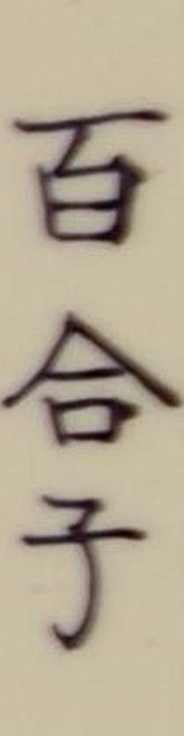百合子
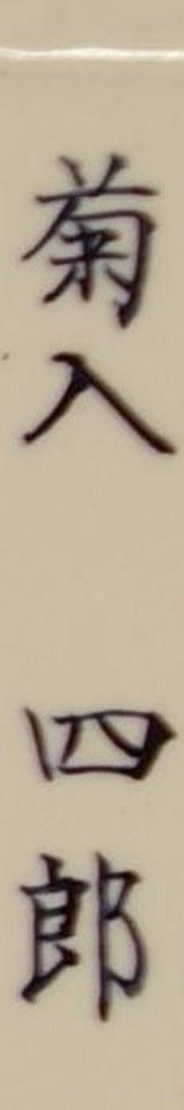菊入四郎
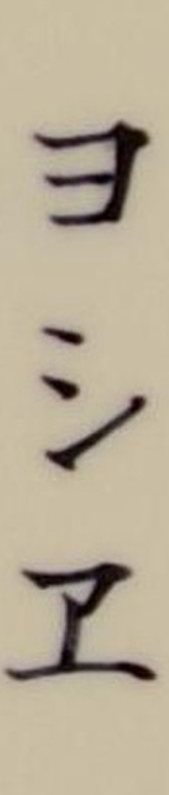ヨシヱ
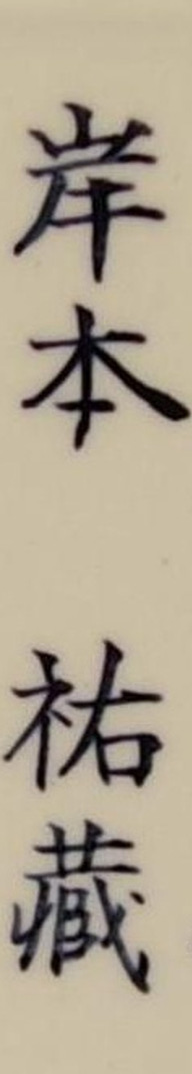岸本祐蔵
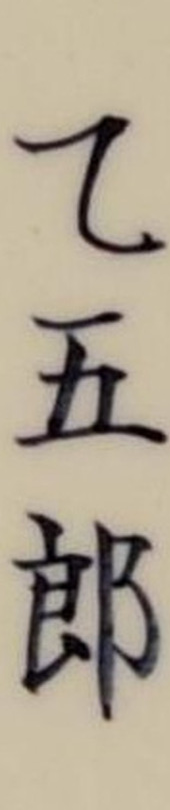乙五郎
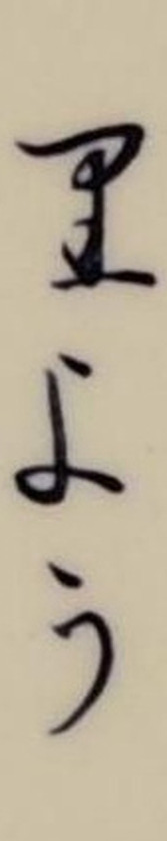りよう
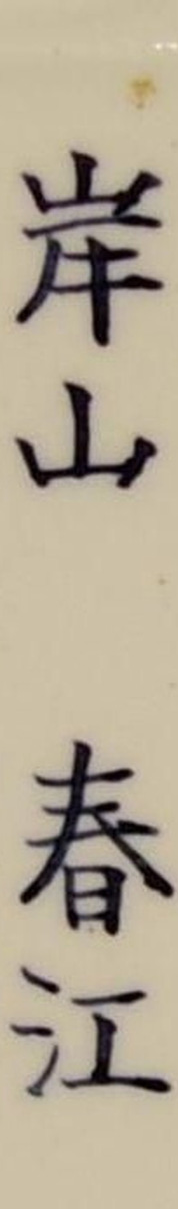岸山春江
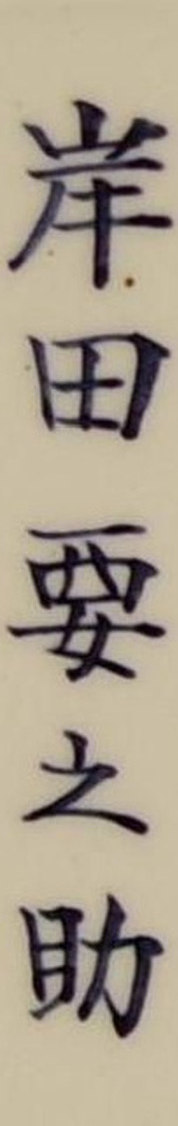岸田要之助
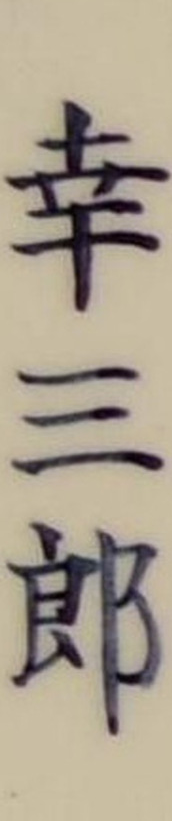幸三郎

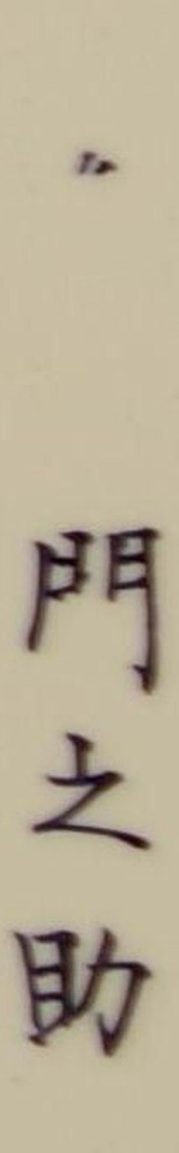門之助
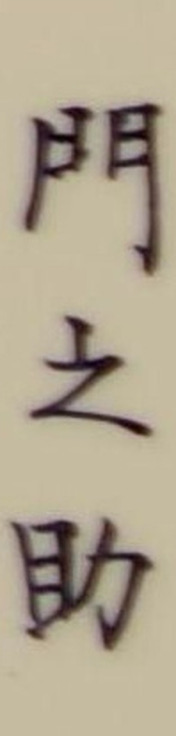門之助
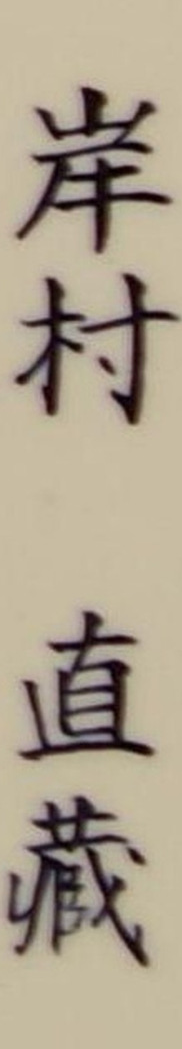岸村直蔵
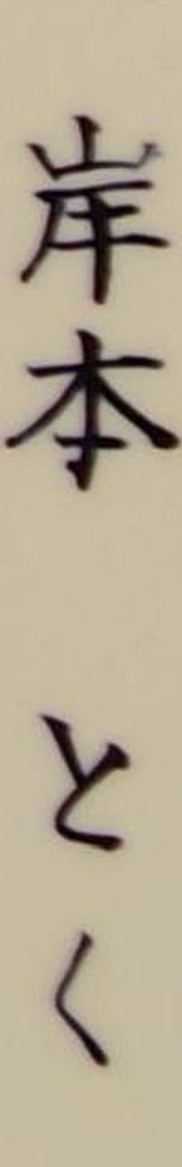岸本とく
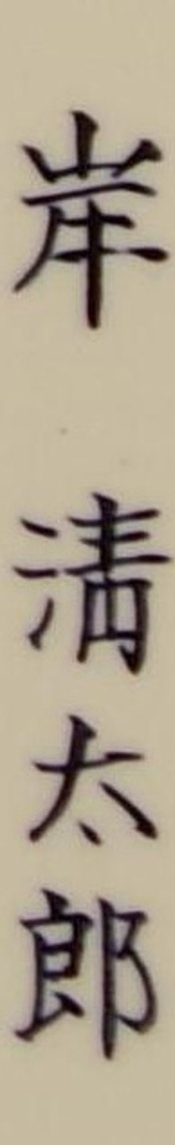岸清太郎
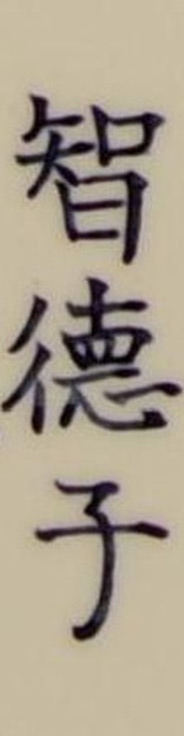智徳子
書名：E~L
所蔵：高野山金剛峯寺
